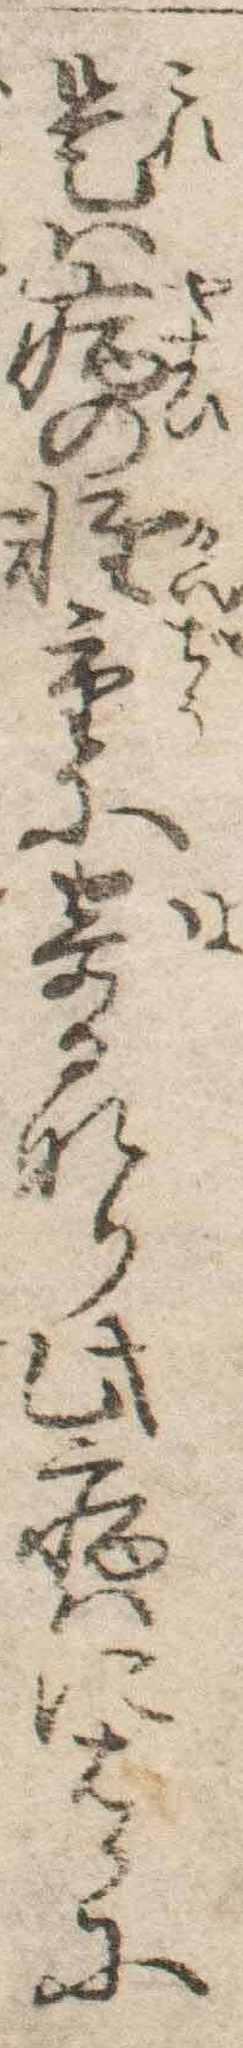是は病の軽重に寄るなり此病はにはかに
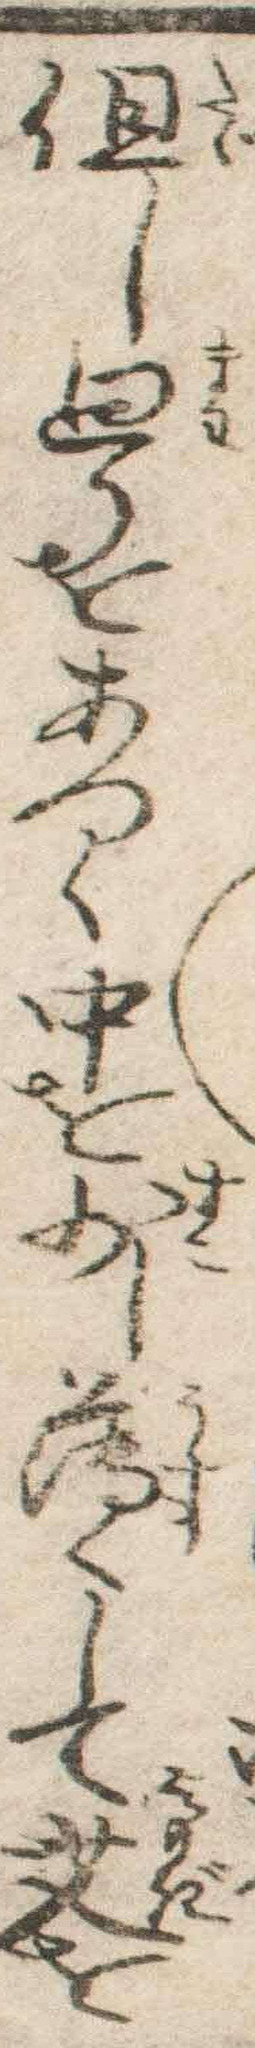但し廻りをあつく中を少し薄くして艾を
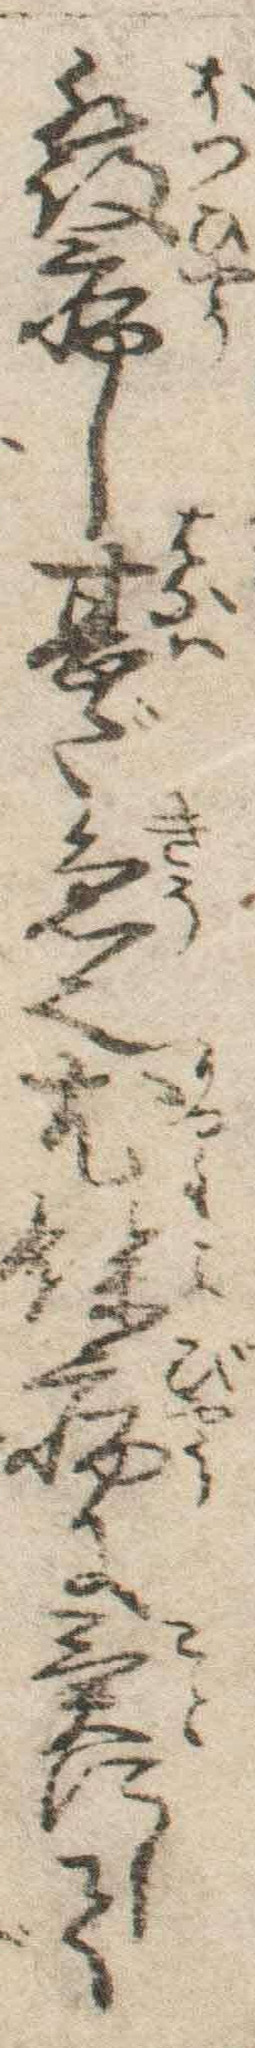発病し甚だ急也尤余病に異にして
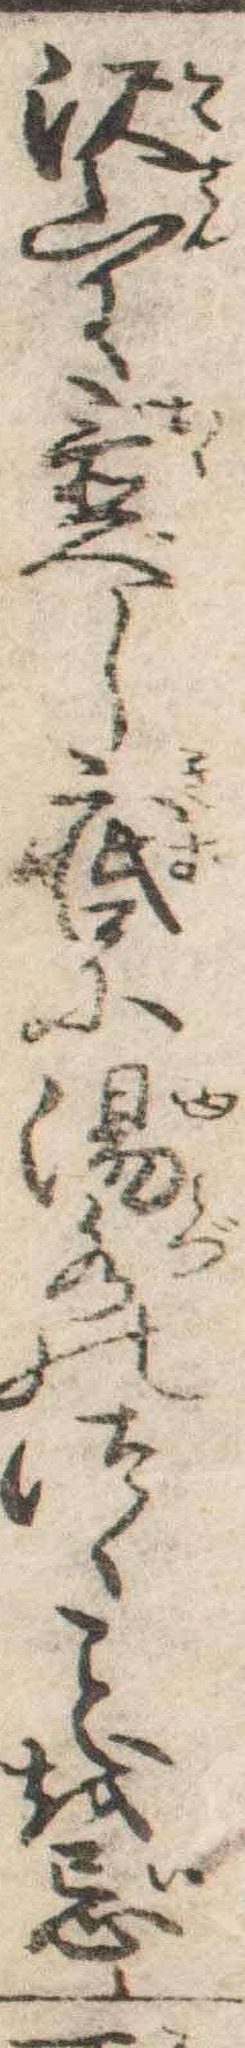沢山に置べし疵に湯水のつくことを忌
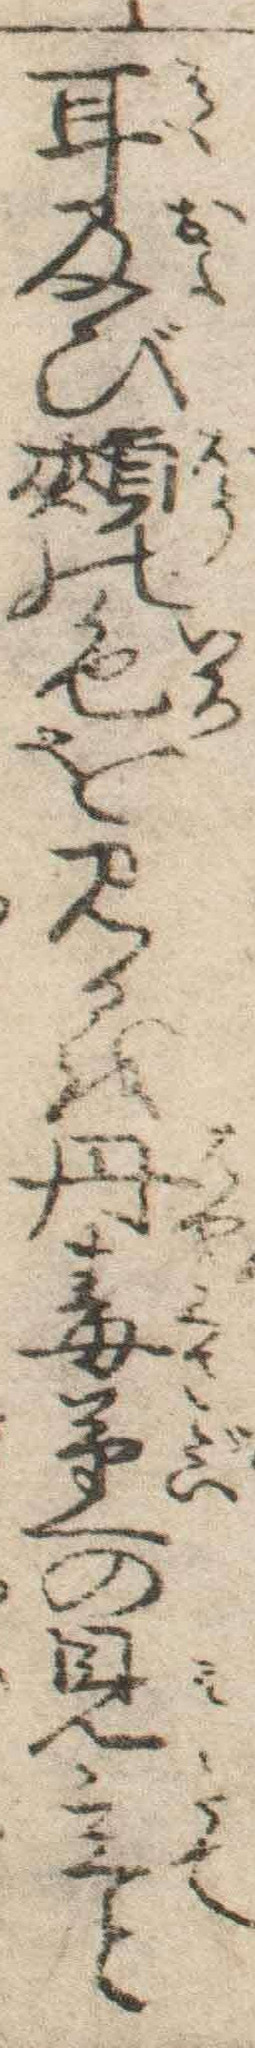耳及び頬の色を見るを丹毒第一の見立と
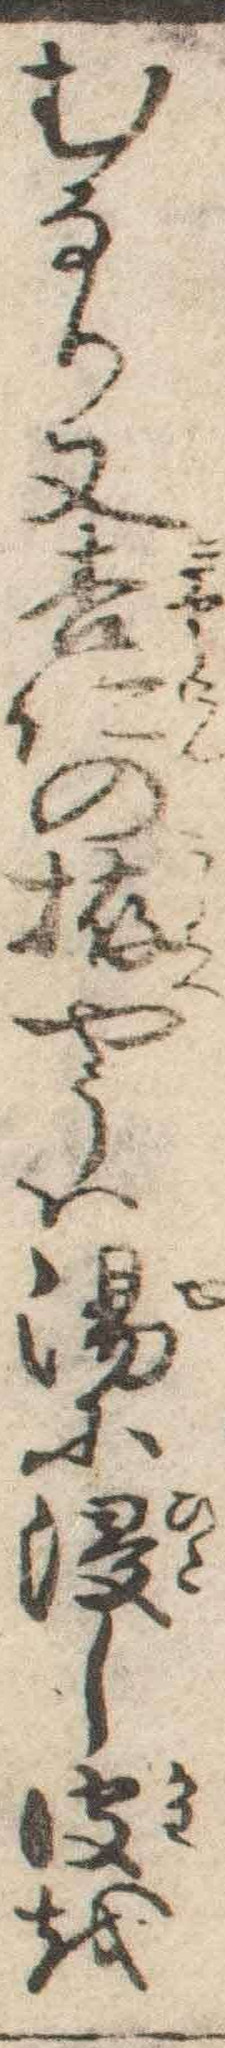むるか又杏仁の拵やうは湯に浸し皮を
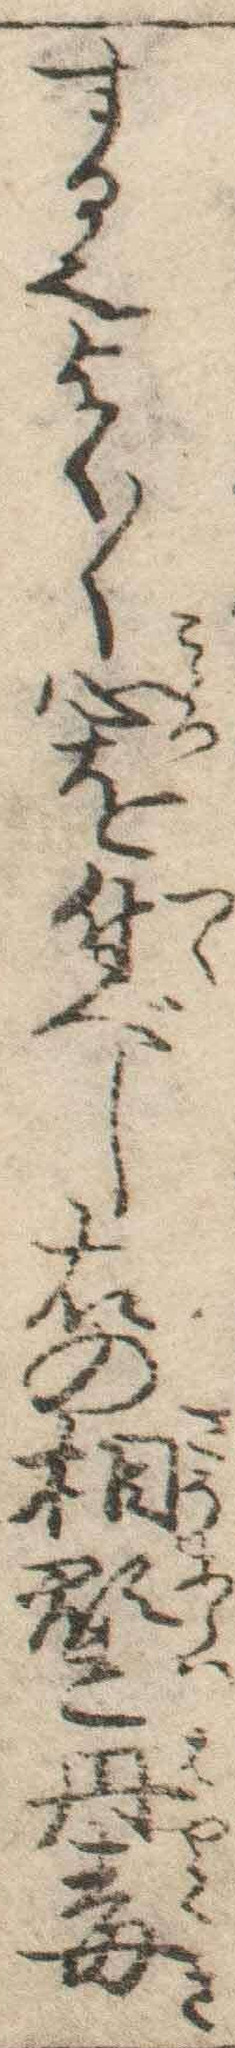する也よく〳〵心を付べし右の相顕れ丹毒

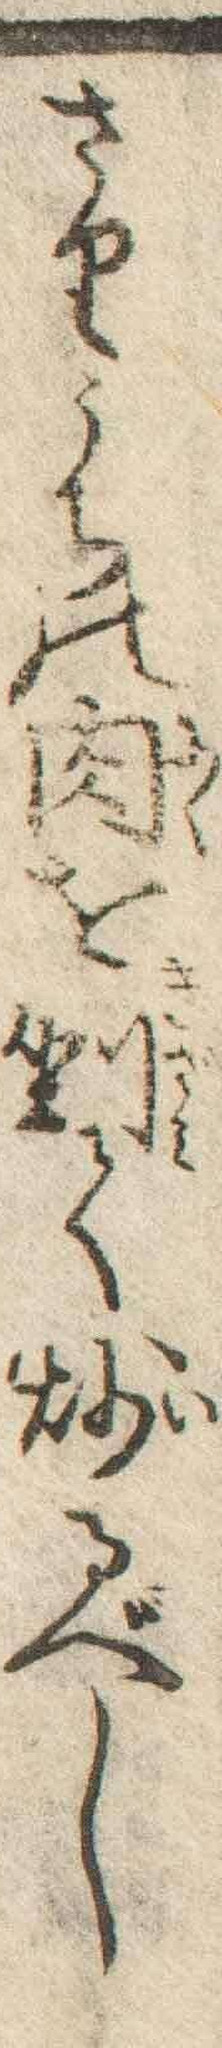さりうちの肉を剉て炒るべし
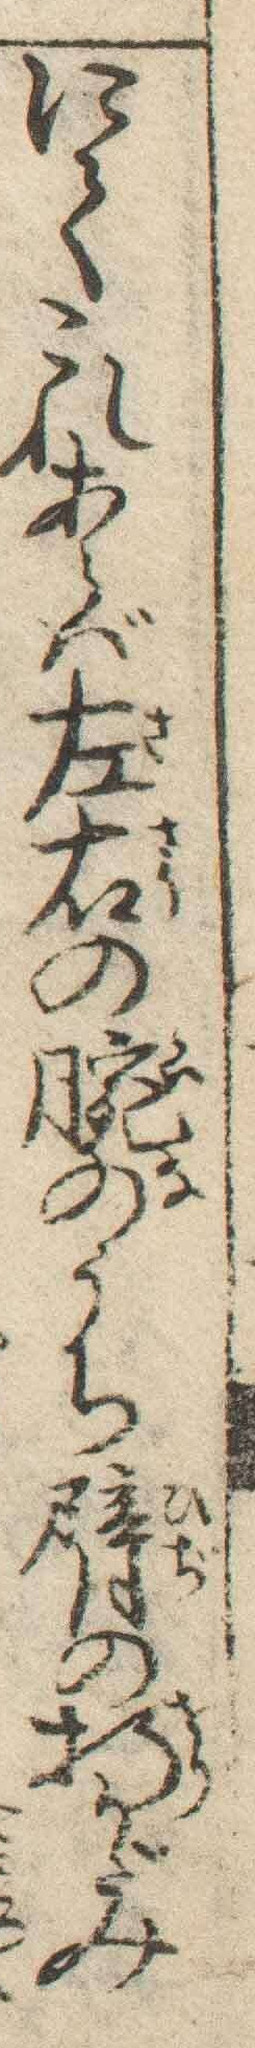にてこれあらば左右の腕のうち臂の折かゞみ
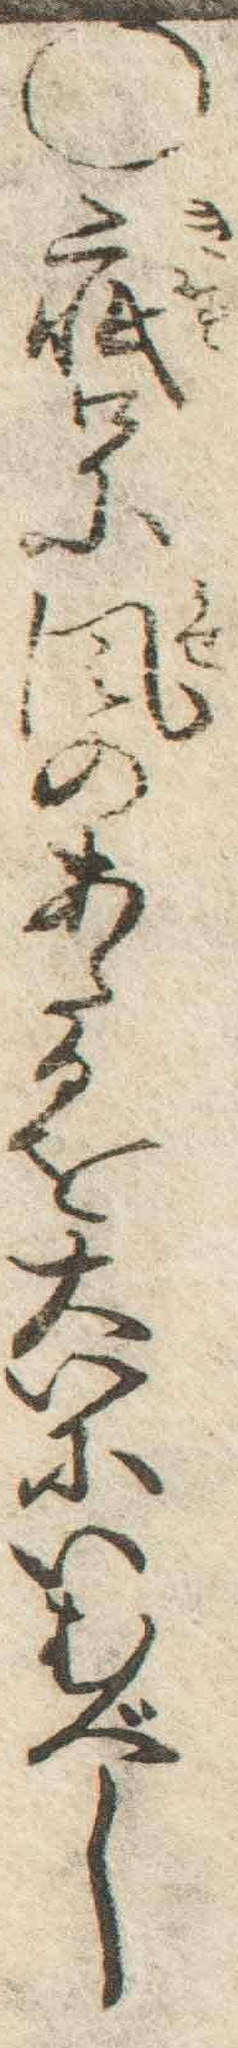〇疵口に風のあたるを大いにいむべし
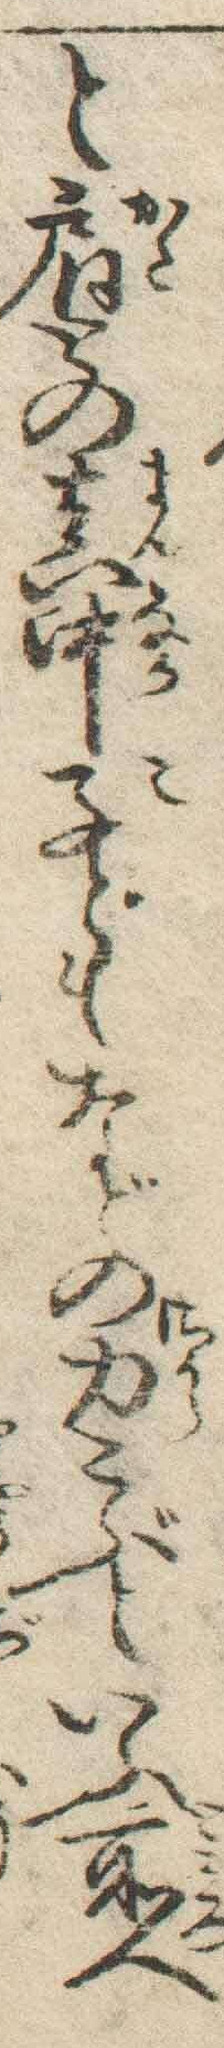と肩との真中子どもなどの力こぶといふ所へ
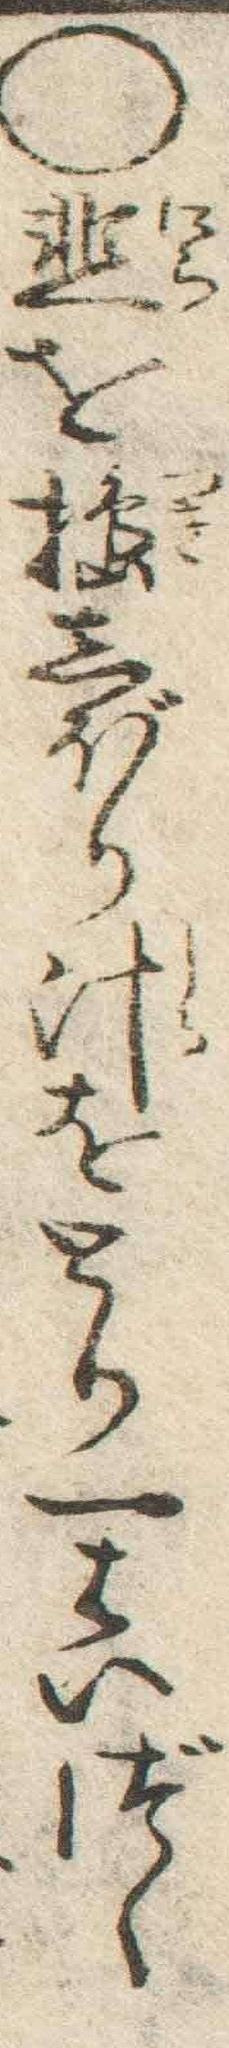〇韮を搗しぼり汁をとり一はいづゝ
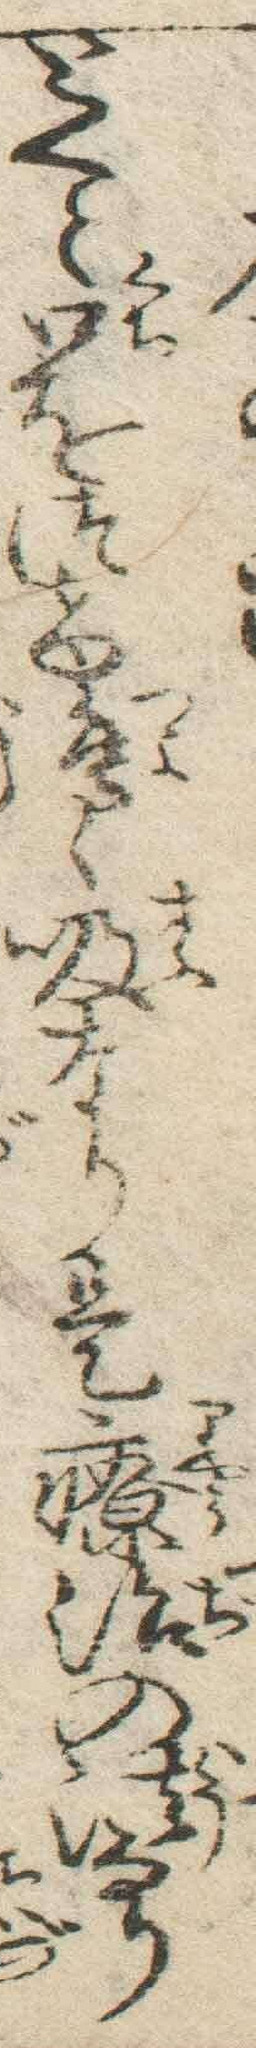とくと口をつけ強く吸なり是療治の法なり
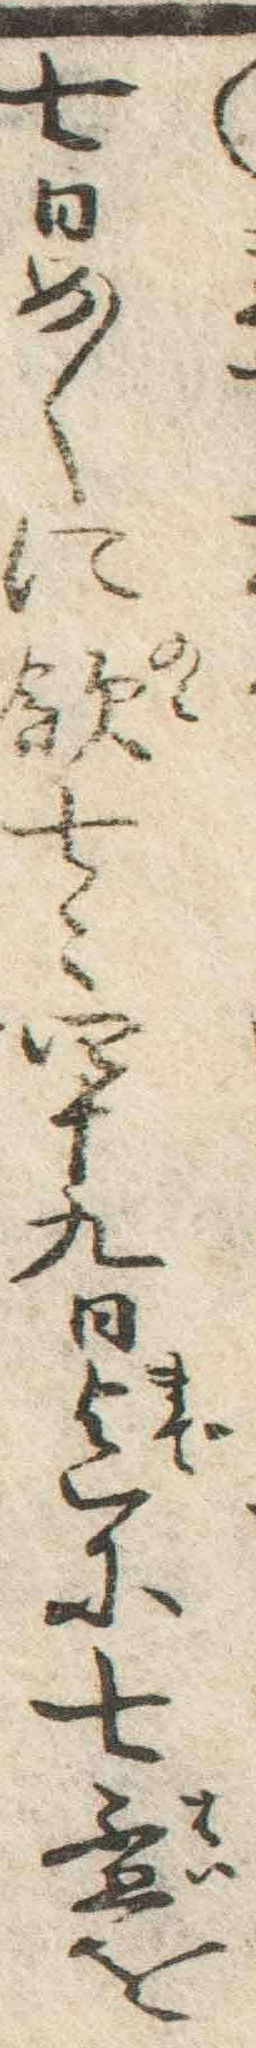七日め〳〵に飲七々四十九日迄に七盃を
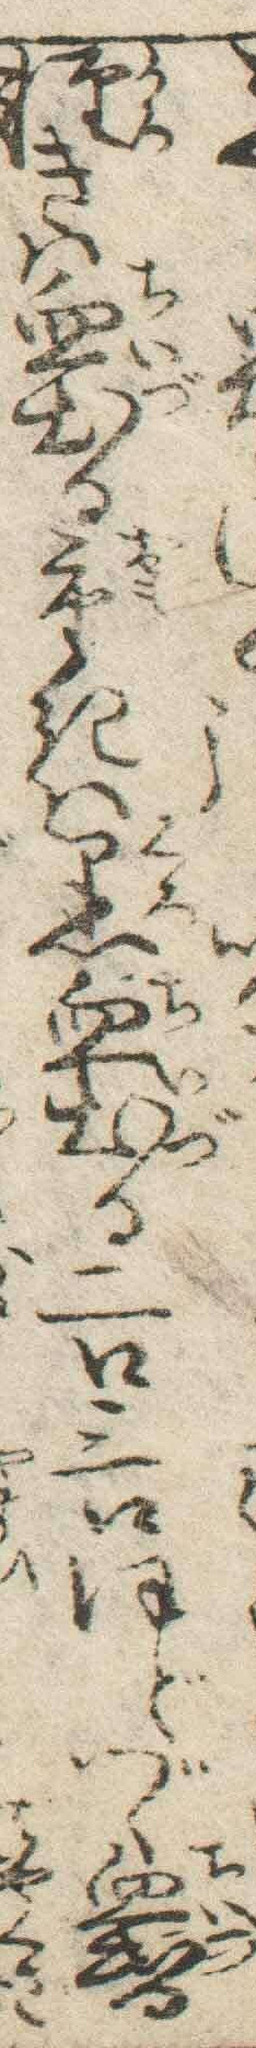軽きは血出る重きは黒血出る二口三口ほどづゝ血出る
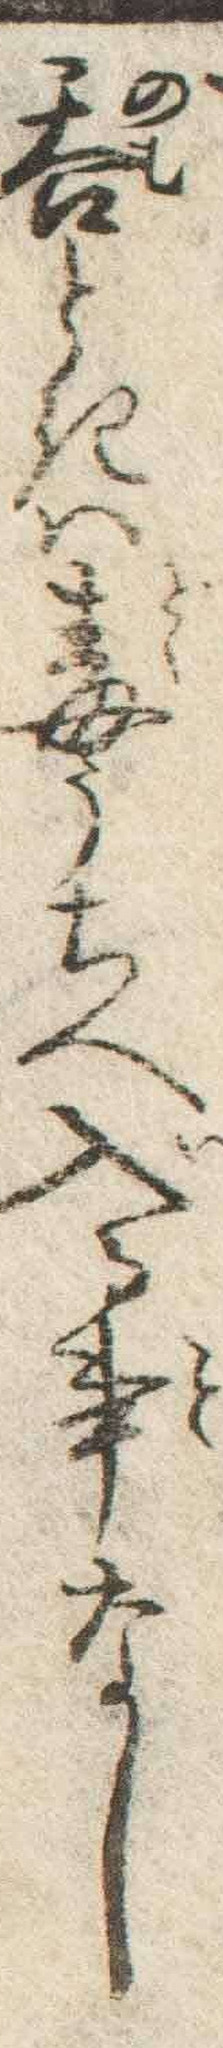呑ときは毒うちへ入る事なし
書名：撫育草
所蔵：東京学芸大学附属図書館 国文学研究資料館
